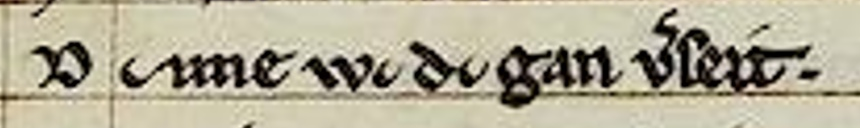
D(az) ime w(az) d(az) gan v(er)ſeit.
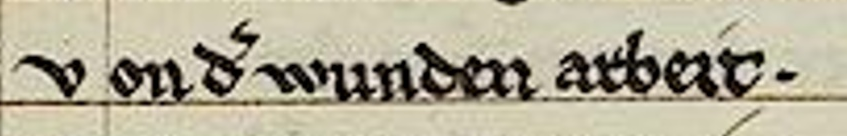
Von d(er) wunden arbeit.
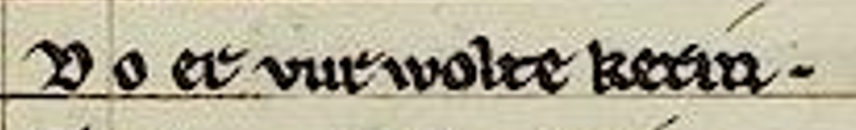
Do er vur wolte kerin.
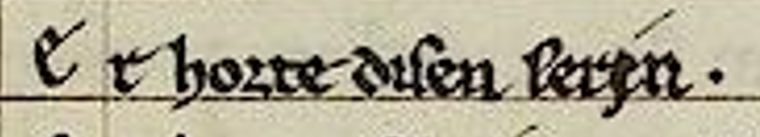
Er horte diſen ſerin.
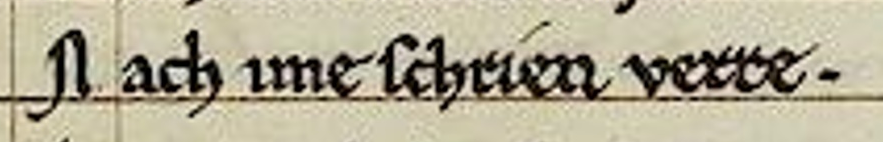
Nach ime ſchrien verre.
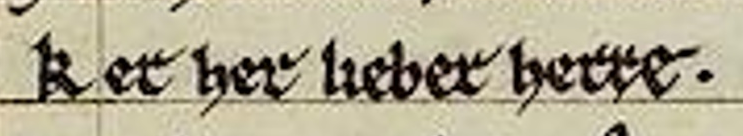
Ker her lieber herre.
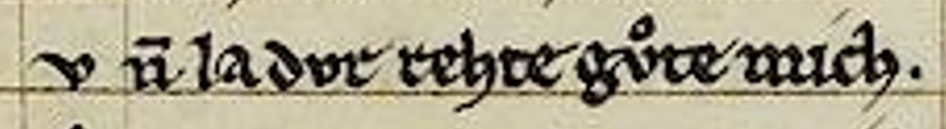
Vn(d) la dvr rehte gv°ote mich.
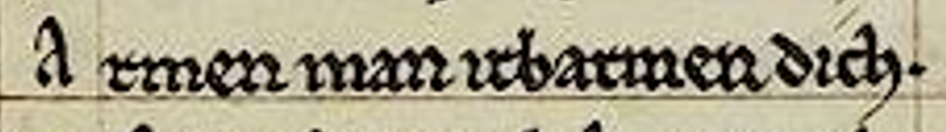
Armen man irbarmen dich.
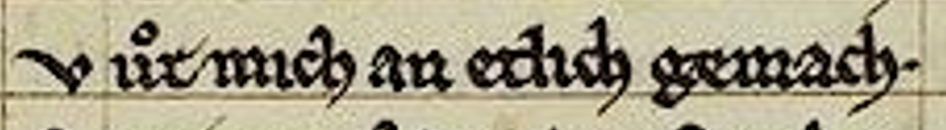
Vu°or mich an etlich gemach.
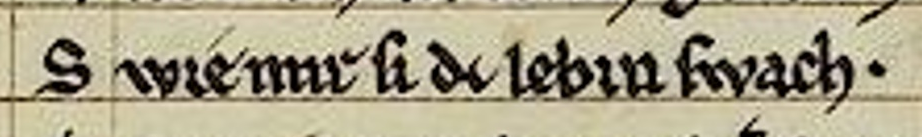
Swie mir ſi d(az) lebin ſwach.
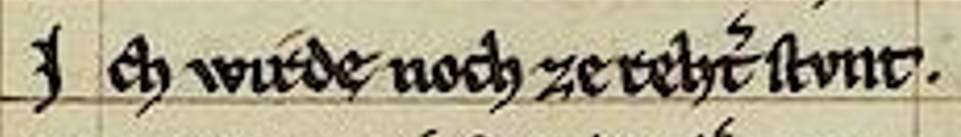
Ich wirde noch ze reht(er) ſtvnt.
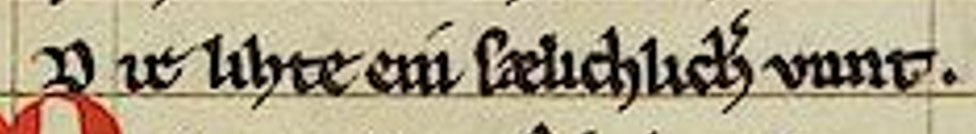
Dir lihte ein ſ[ae]lichlich(er) vunt.
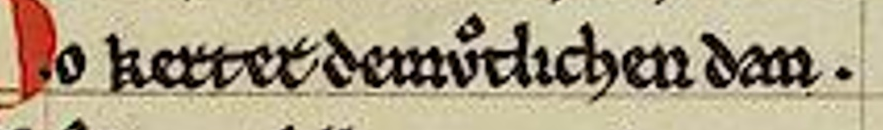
*Do kerter demv°otlichen dan.
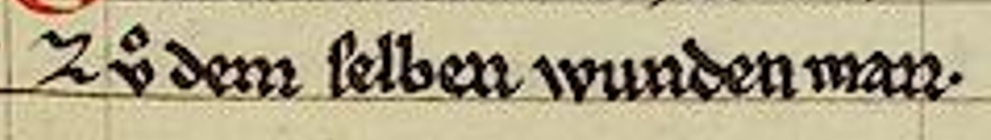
Zv°o dem ſelben wunden man.
